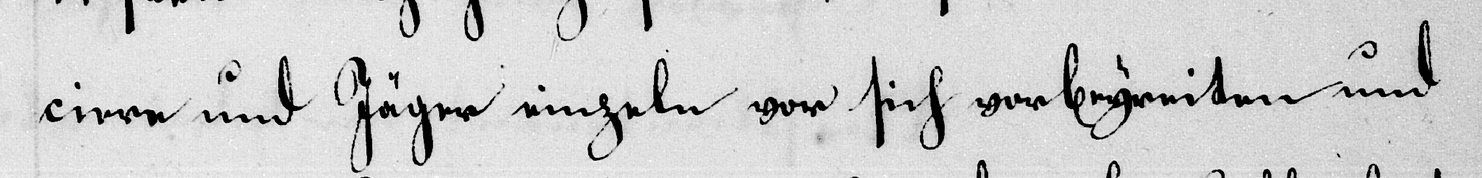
ciere und Jäger einzeln vor sich vorbeyreiten und
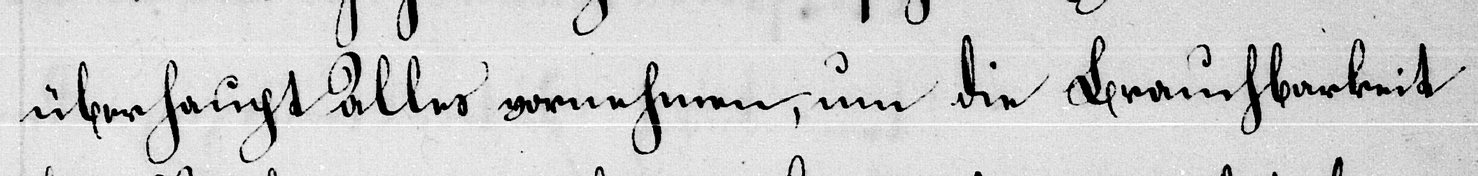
überhaupt alles vornehmen, um die Brauchbarkeit
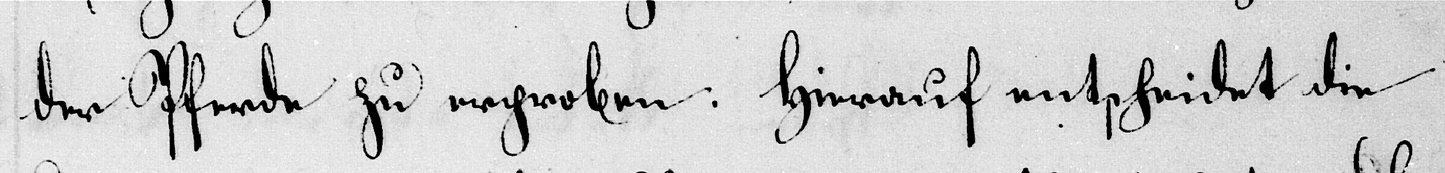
der Pferde zu erproben. Hierauf entscheidet die
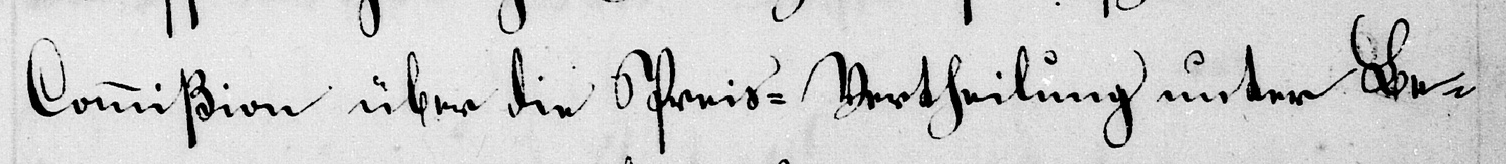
Commißion über die Preis-Vertheilung unter Be¬
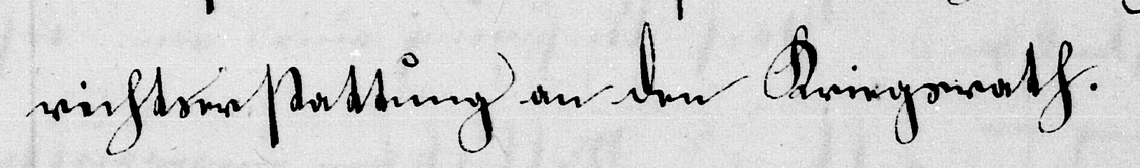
richterstattung an den Kriegsrath.
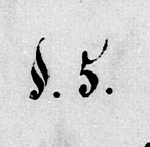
§. 5.
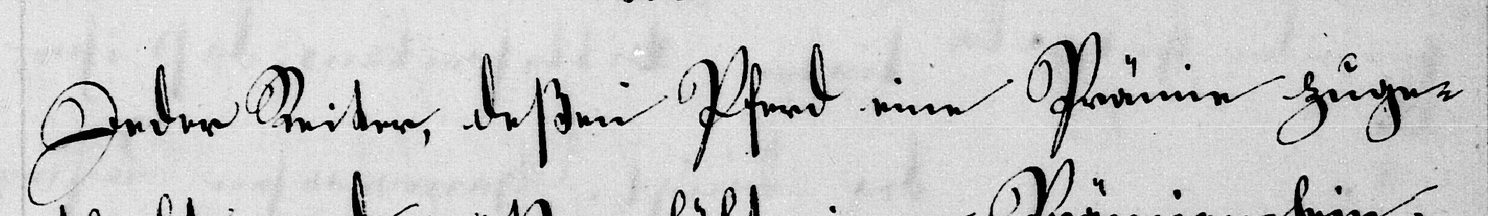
Jeder Reiter, deßen Pferd eine Prämie zuge¬
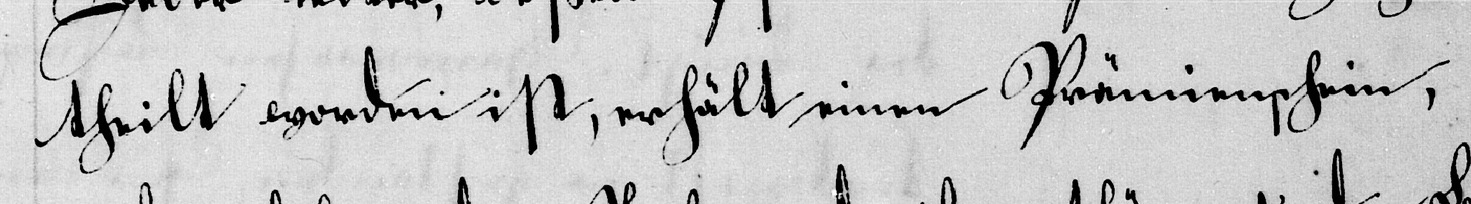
theilt worden ist, erhält einen Prämienschein,
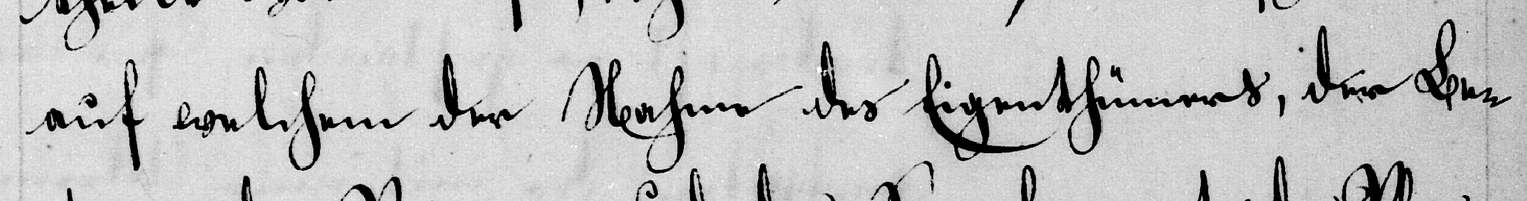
auf welchem der Nahme des Eigenthümers, der Be¬
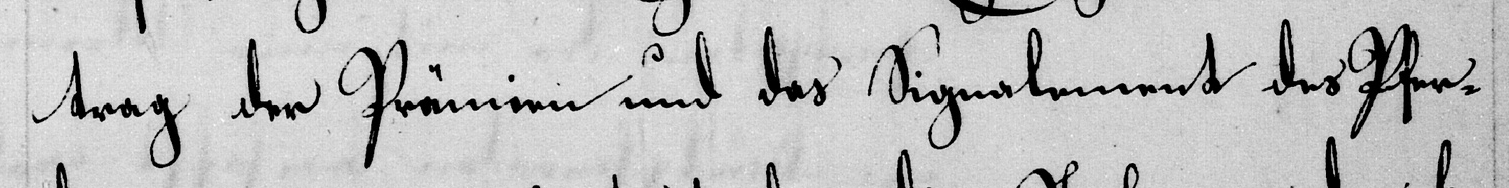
trag der Prämie und das Signalement des Pfer¬
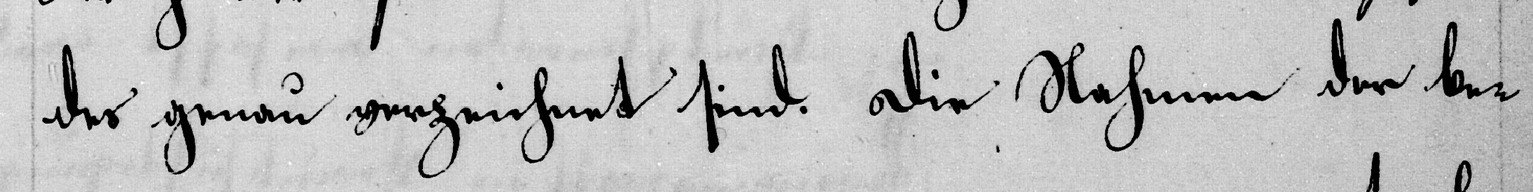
des genau verzeichnet sind. Die Nahmen der be-
